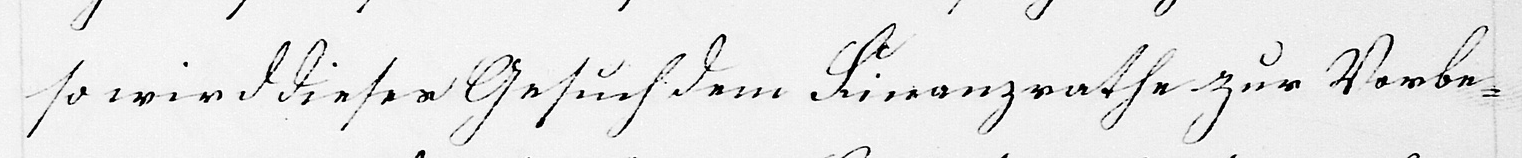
so wird dieses Gesuch dem Finanzrathe zur Vorbe¬
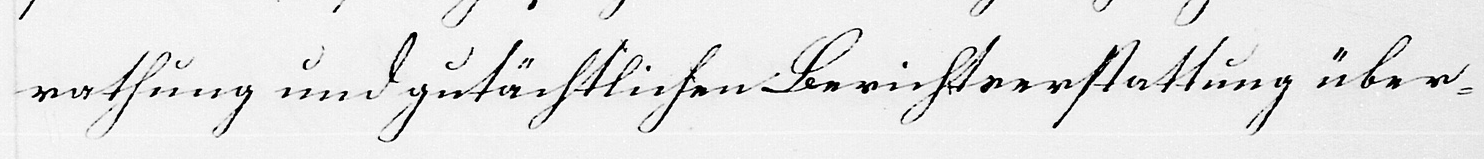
rathung und gutächtlichen Berichtserstattung über¬
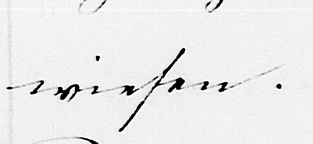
wiesen.
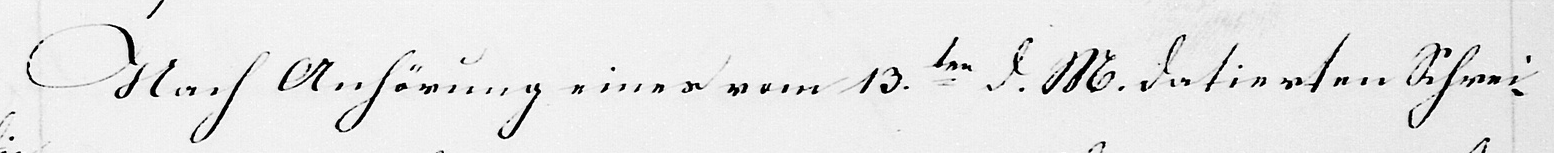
Nach Anhörung eines vom 13.ten d. M. datierten Schrei¬
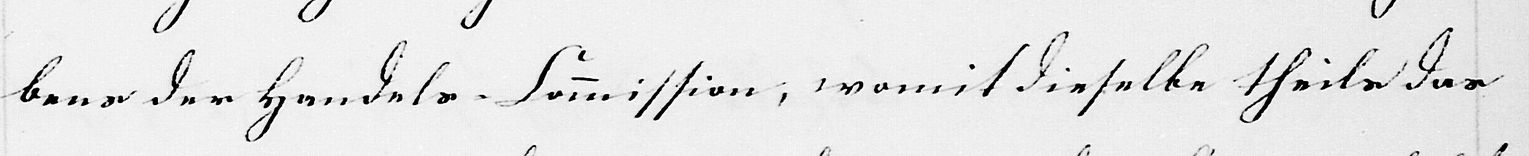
bens der Handels-Commission, womit dieselbe theils das
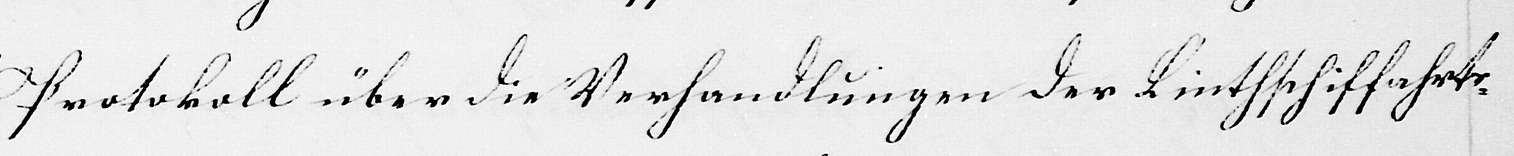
Protokoll über die Verhandlungen der Linthschiffahrt¬
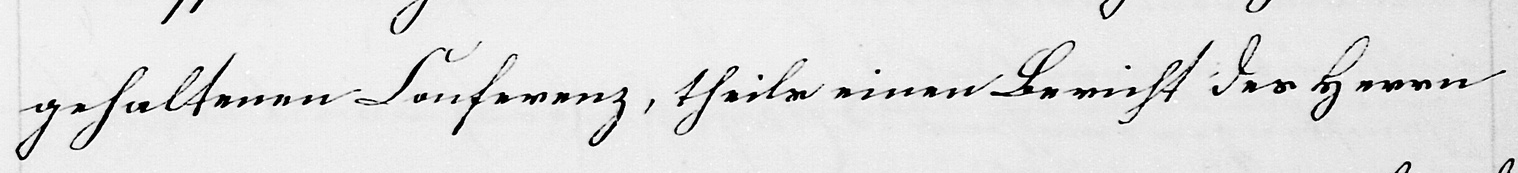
gehaltenen Conferenz, theils einen Bericht des Herrn
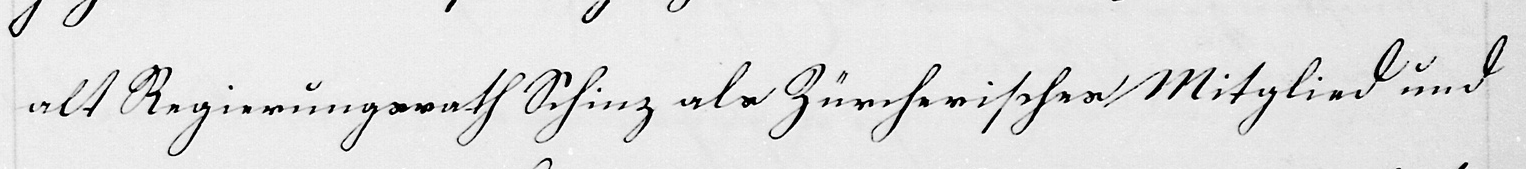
alt Regierungsrath Schinz als Zürcherisches Mitglied und
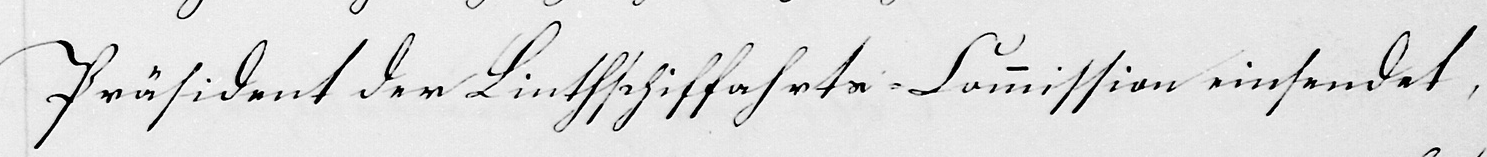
Präsident der Linthschiffahrts-Commission einsendet,
